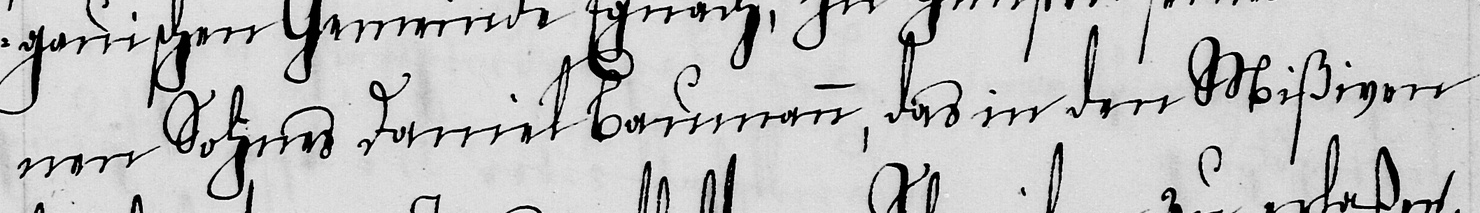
nen Sohnes Daniel Baumann, das in den Mißiven
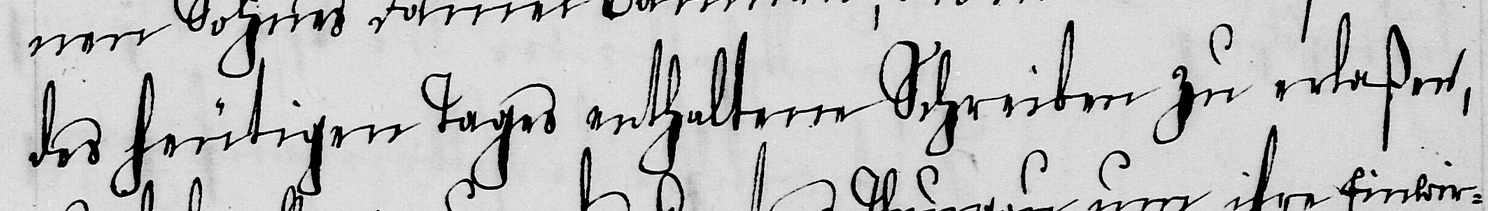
des heutigen Tages enthaltene Schreiben zu erlaßen,
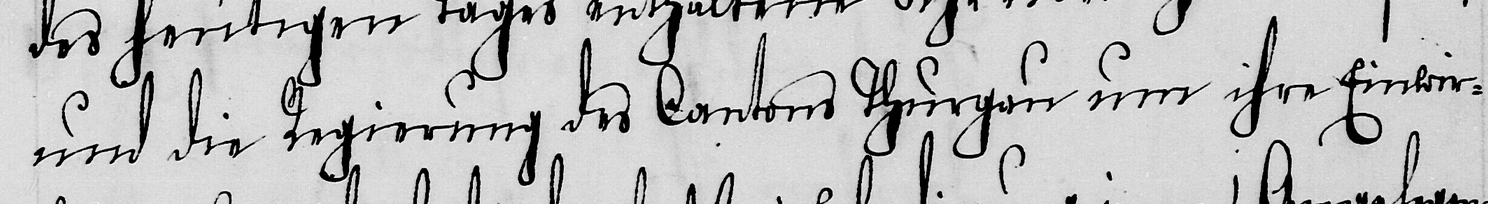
und die Regierung des Cantons Thurgau um ihre Einwir¬
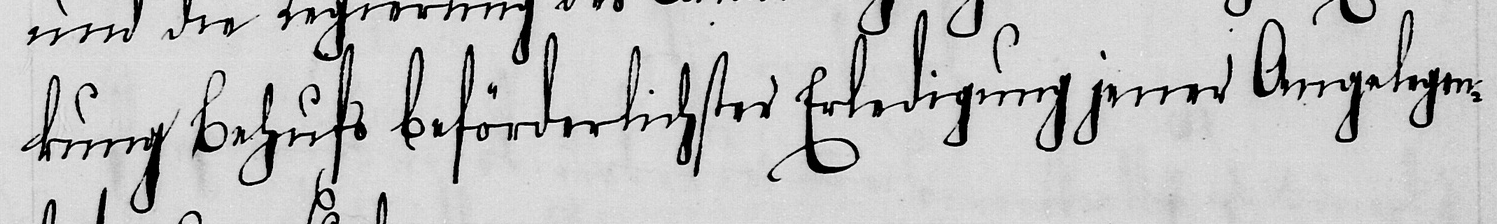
kung Behufs beförderlichster Erledigung jener Angelegen¬
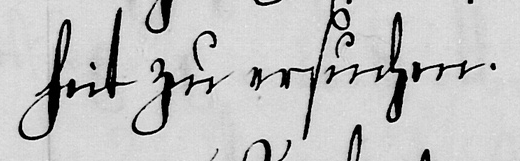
heit zu ersuchen.
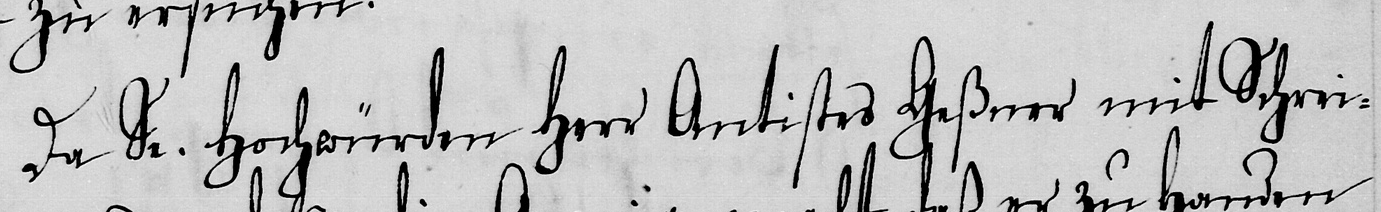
Da Se. Hochwürden Herr Antistes Geßner mit Schrei¬
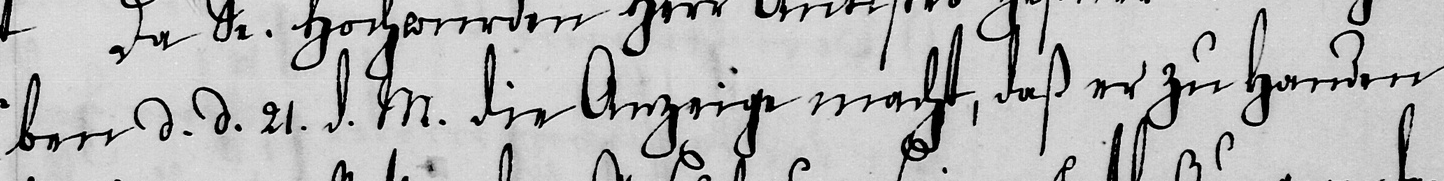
ben d. d. 21. d. M. die Anzeige macht, daß er zu Handen
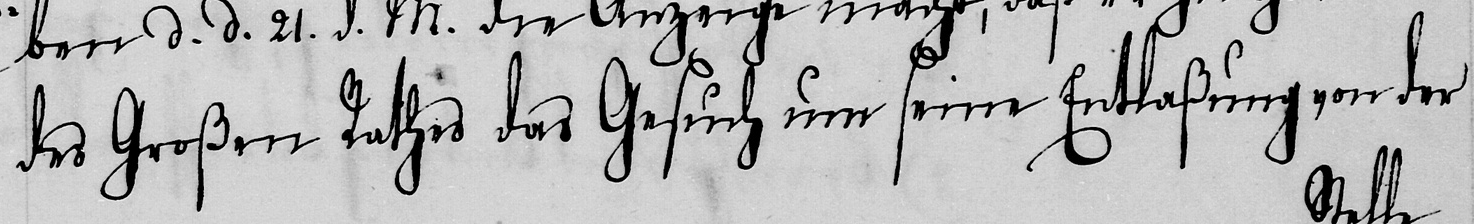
des Großen Rathes das Gesuch um seine Entlaßung von der
